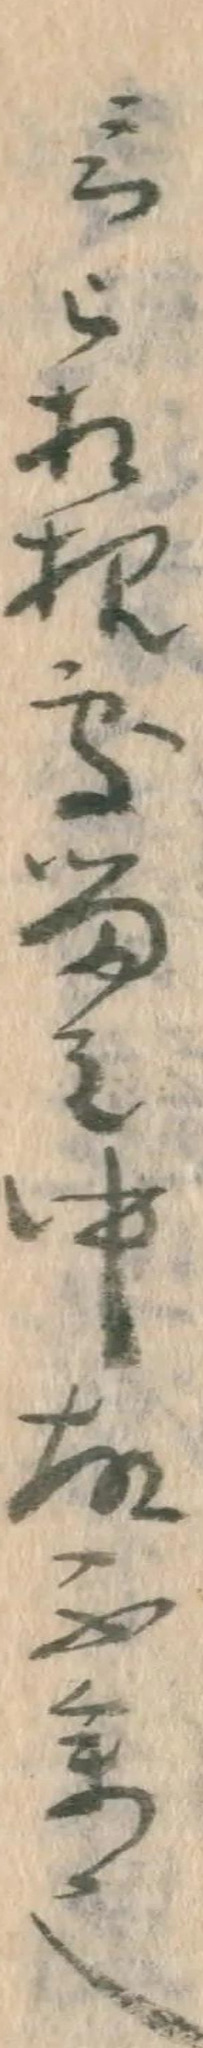ニ而被相招處、留主中故不参也、
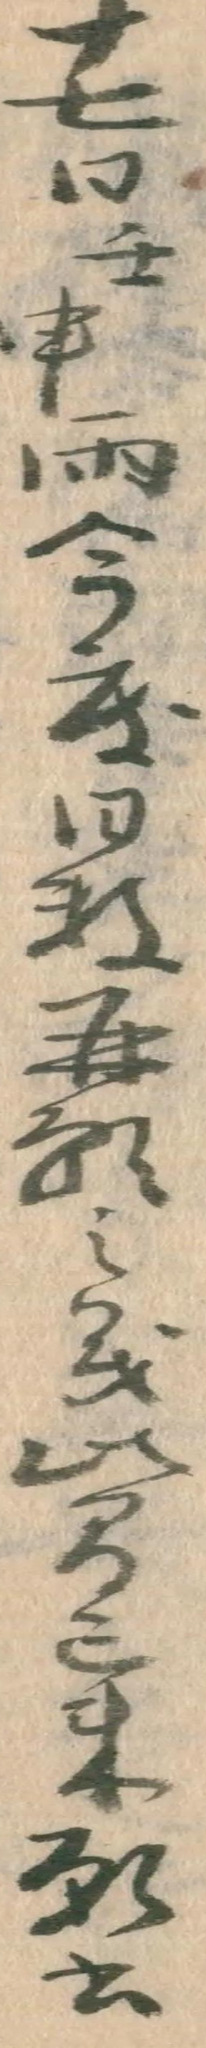十七日壬申雨、今度日数再願之義、此間巳来願書
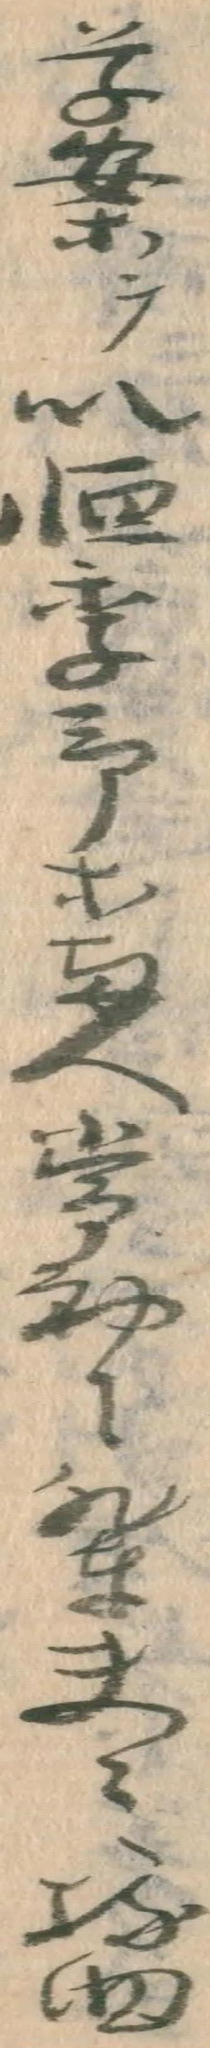学案を以桓季・予等両人常勤之輩、夫々へ持回
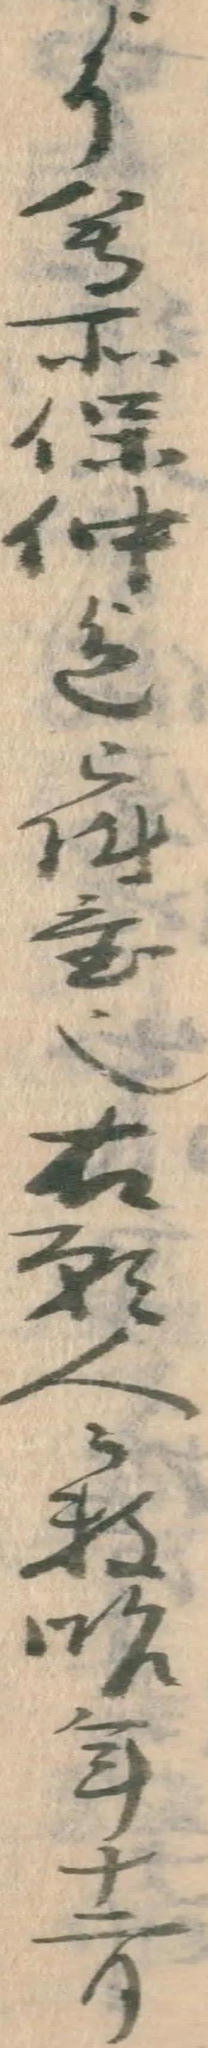より會所保仲迄被附置也、右願人被数、昨年十二月
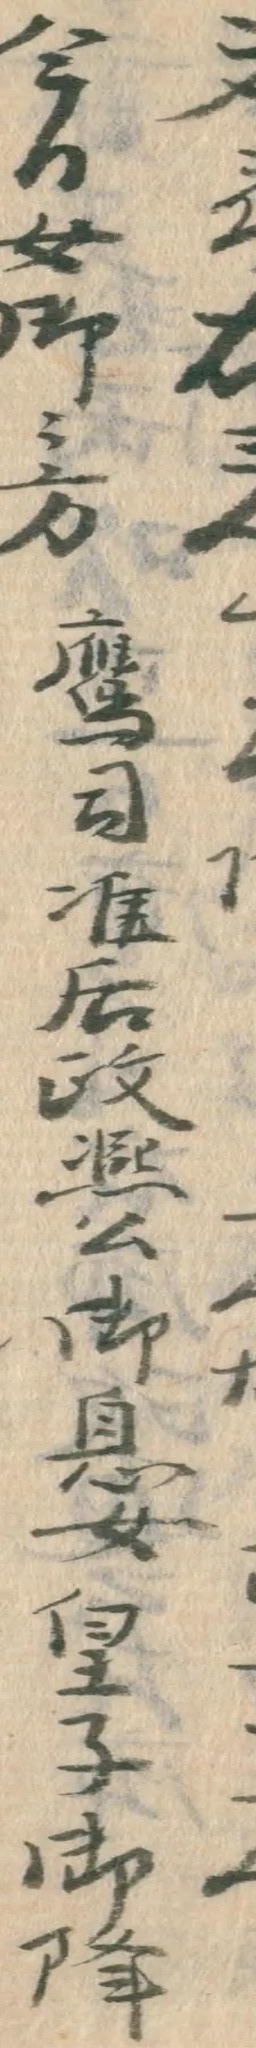今日女御〻方、鷹司准后政熙公御息女、皇子御降
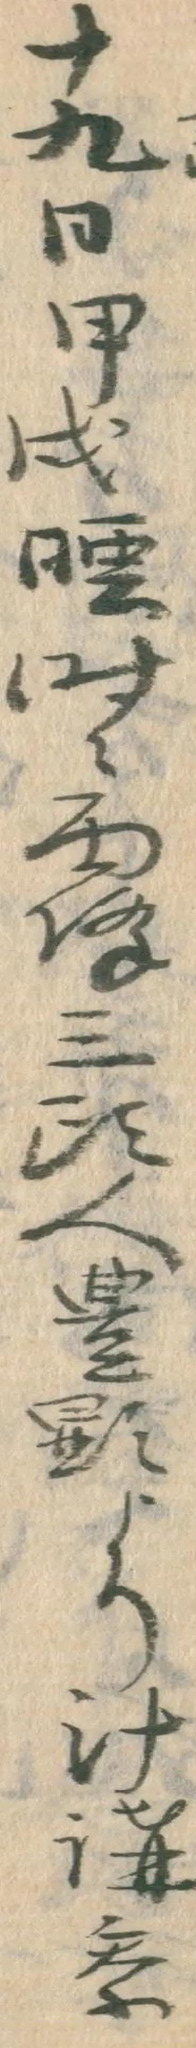十九日甲戌晴時〻雨降、三頭人豊顕より汁講参
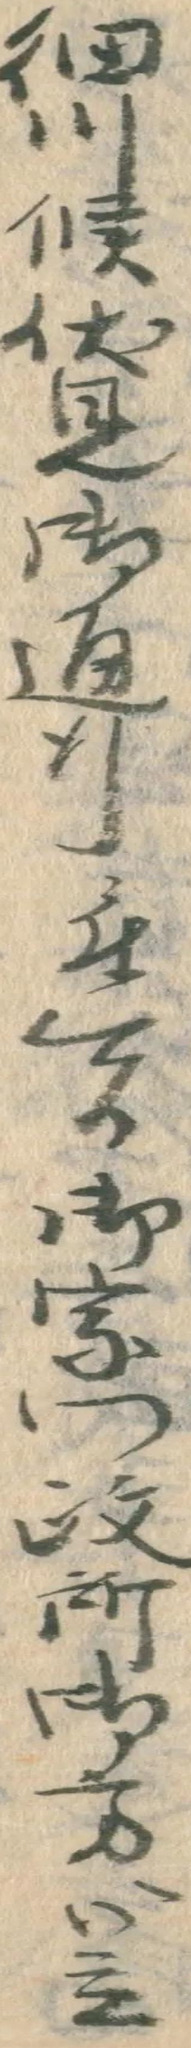細川候、伏見御通行ニ付、今日御家門政所御方へ御立
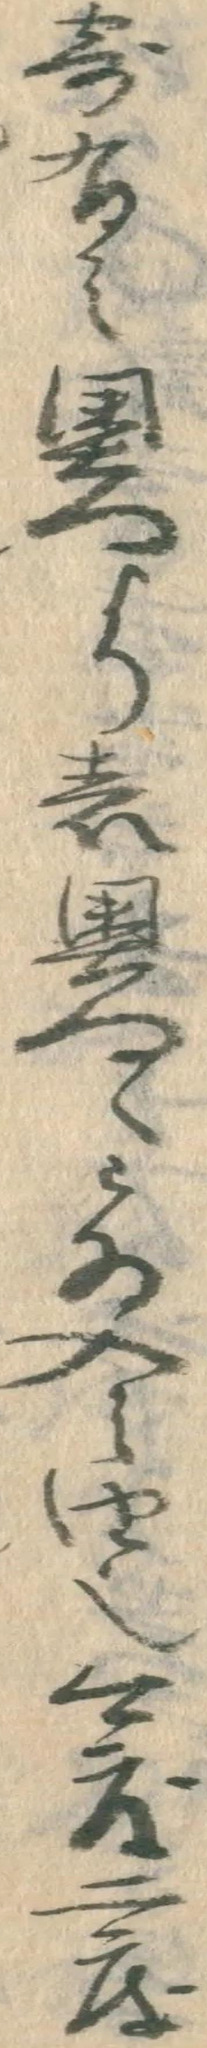寄有之、奥向より表奥向へ被為入之由也、今度二度
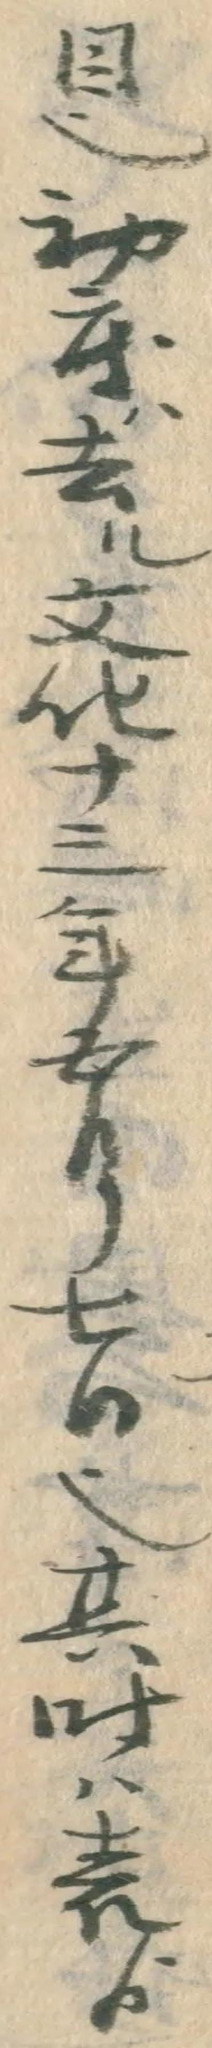目也、初度ハ去ル文化十三年五月七日也、其時ハ表ゟ

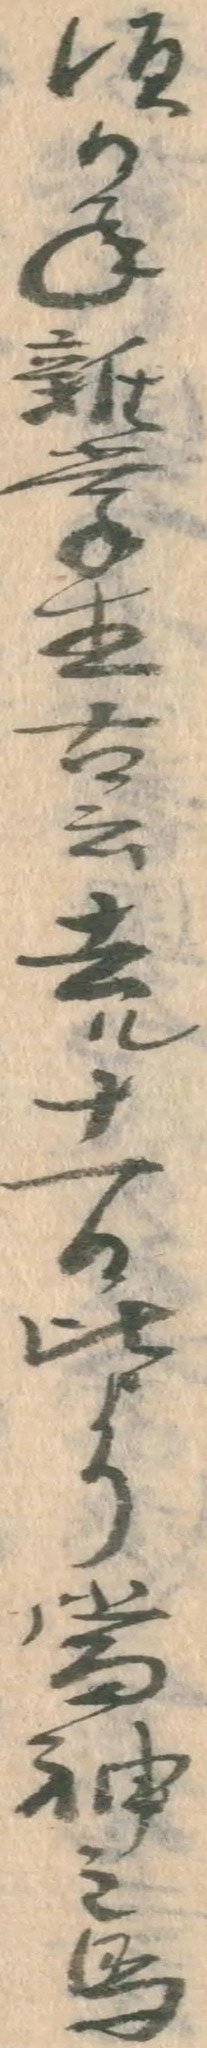頃日承、雑掌直古云、去ル十一日比より當神之鳥
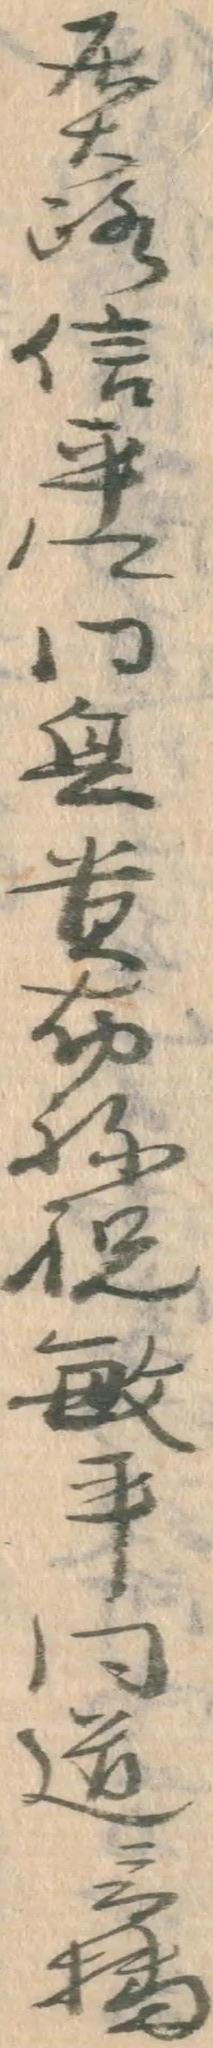居大路信平卿同奥、貴布称祝敏平同道ニ而、播
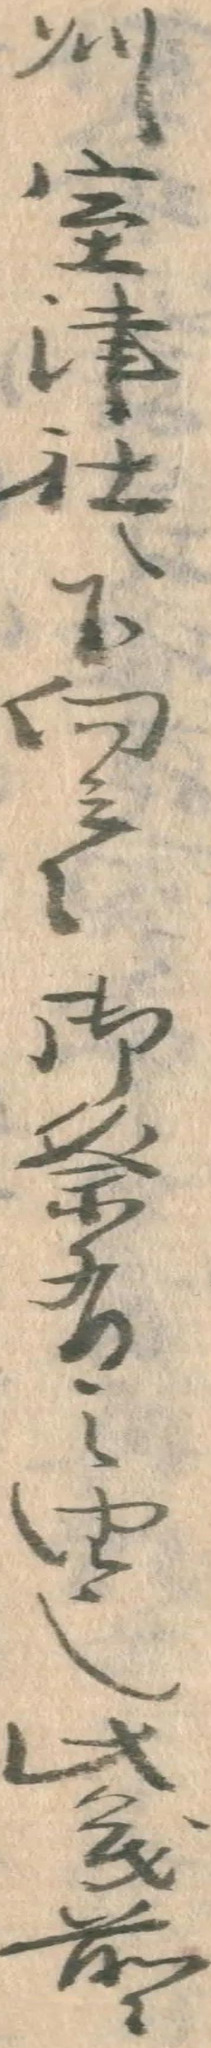州室津社へ下向云々、御祭有之由也、此義、前〻
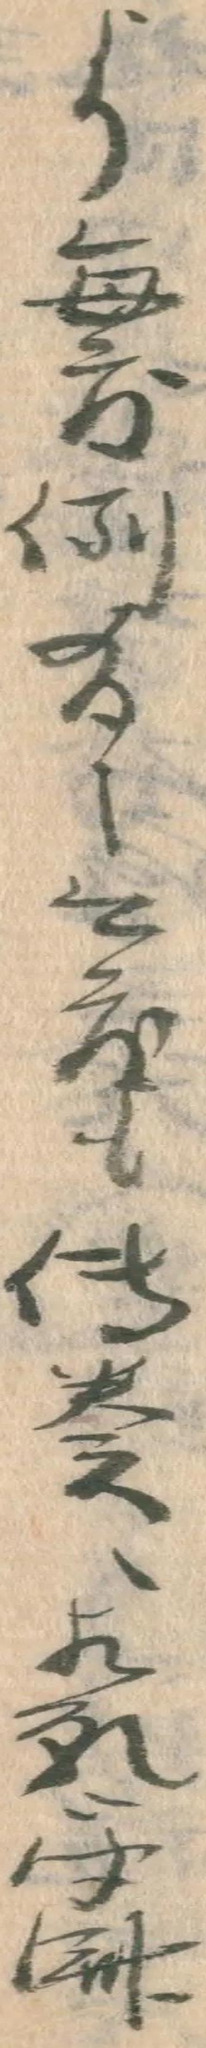より毎度例有之、今度も傳奏へ相願御聞済
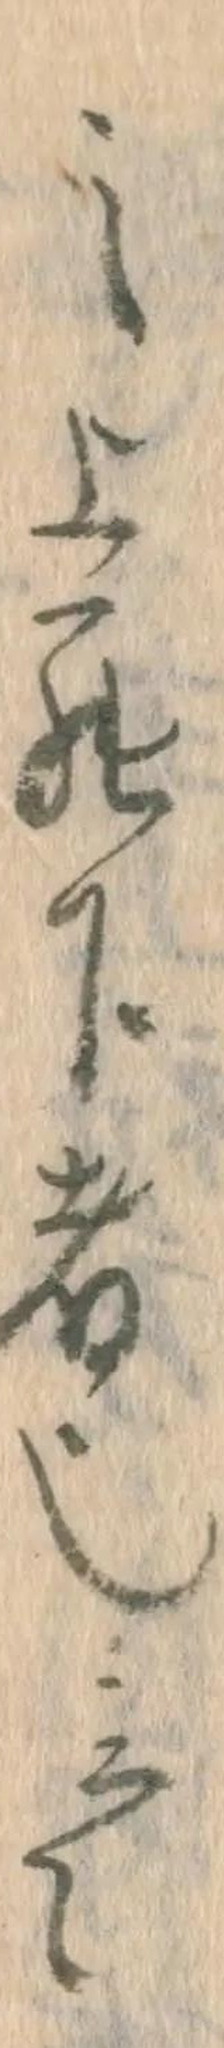之上罷下者也云々、
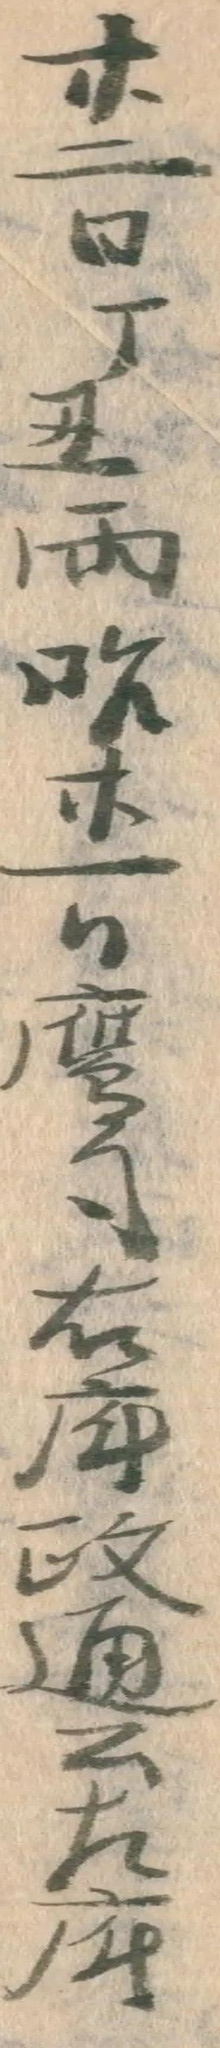廿二日丁丑雨、昨廿一日、鷹司右府政通公、左府
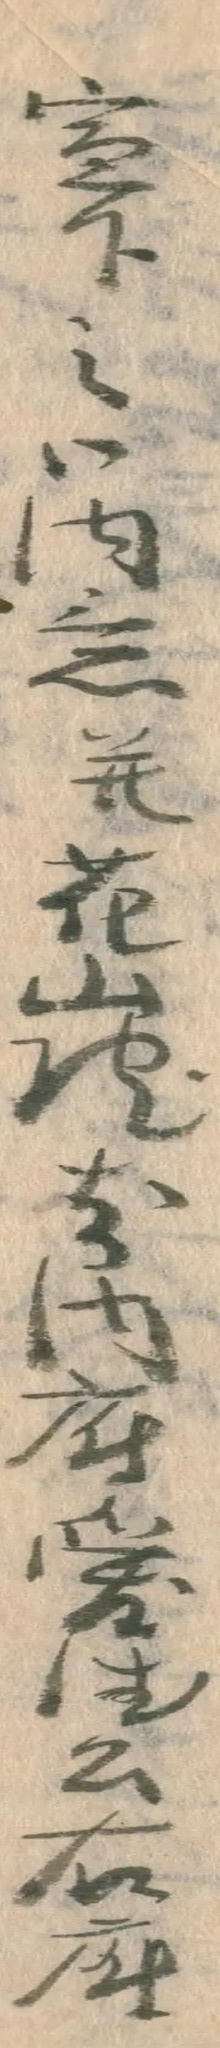宣下之御内意幷花山院前内府愛徳公右府
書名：賀茂社記録. 第63冊
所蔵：国立国会図書館 National Diet Library, JAPAN
